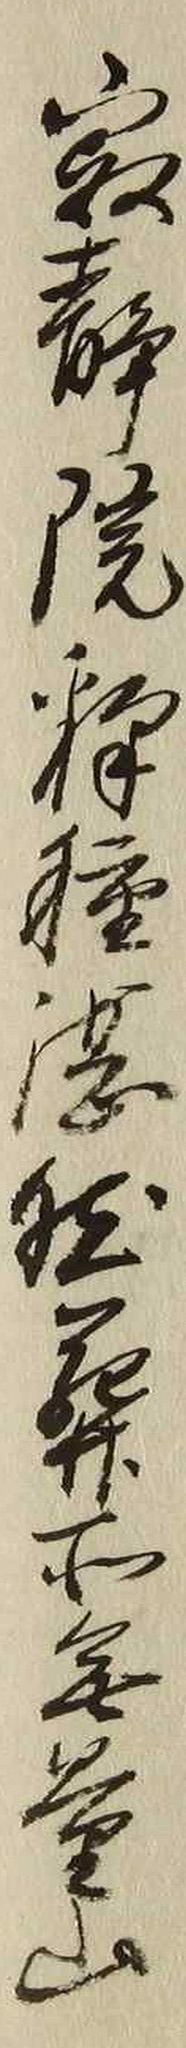寂静院釈種湛然葬所年無量山
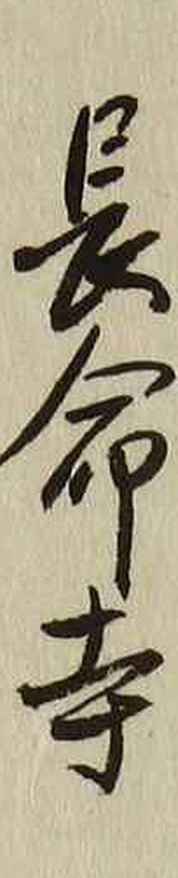長命寺
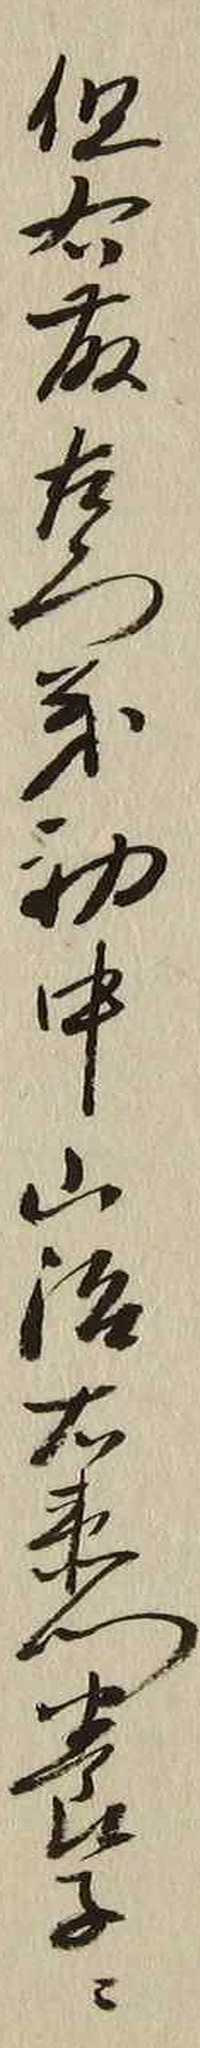但右藤左衛門義初中山治右衛門養子ニ
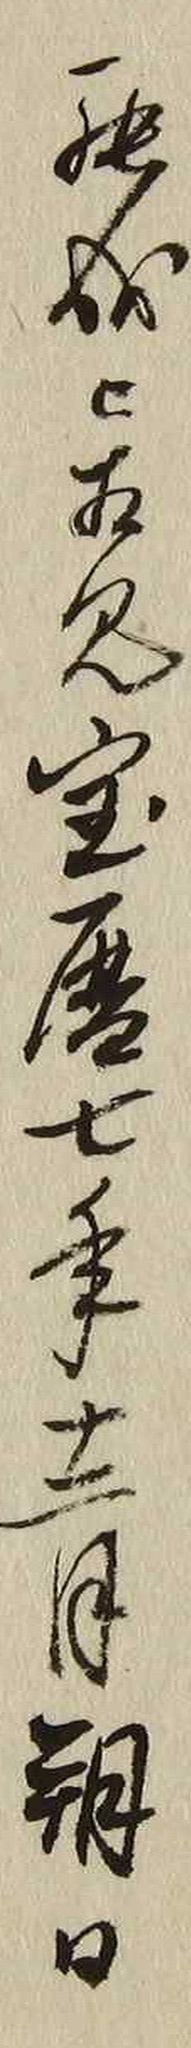罷成と相見宝暦七年十二月朔日
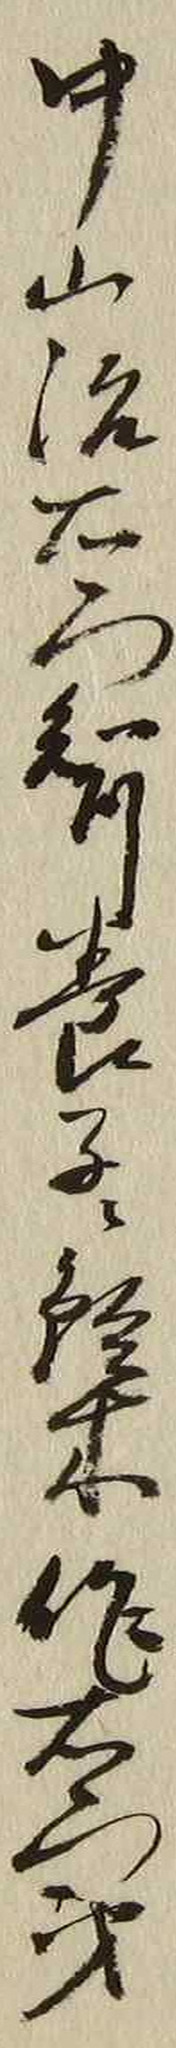中山治右衛門婿養子ニ鈴木作右衛門弟
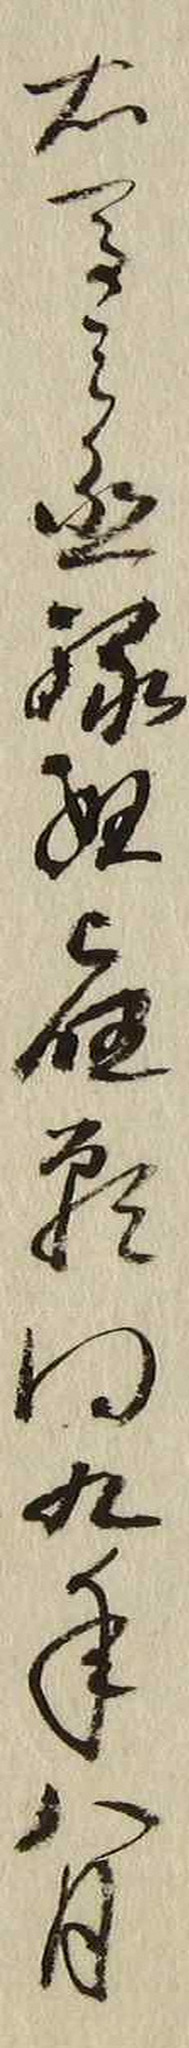右馬之丞縁組被任願同九年八月
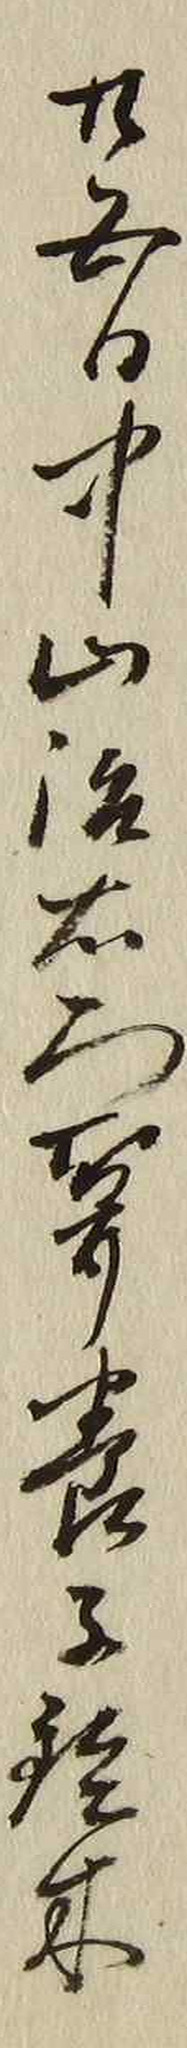廿五日中山治右衛門婿養子鈴木
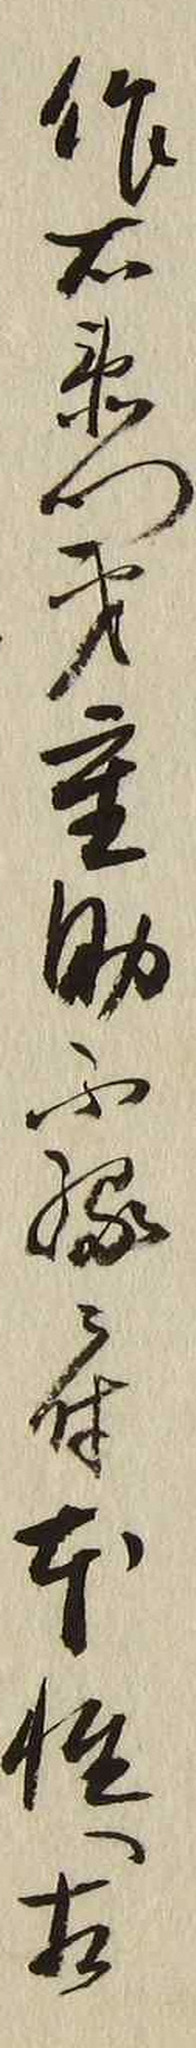作右衛門弟重助不縁ニ付本性へ相
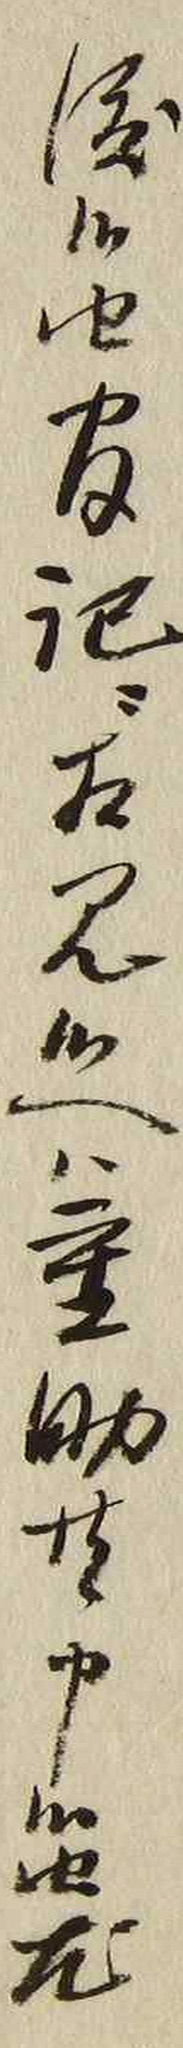渡候由官記ニ相見候へハ重助共申候由尤
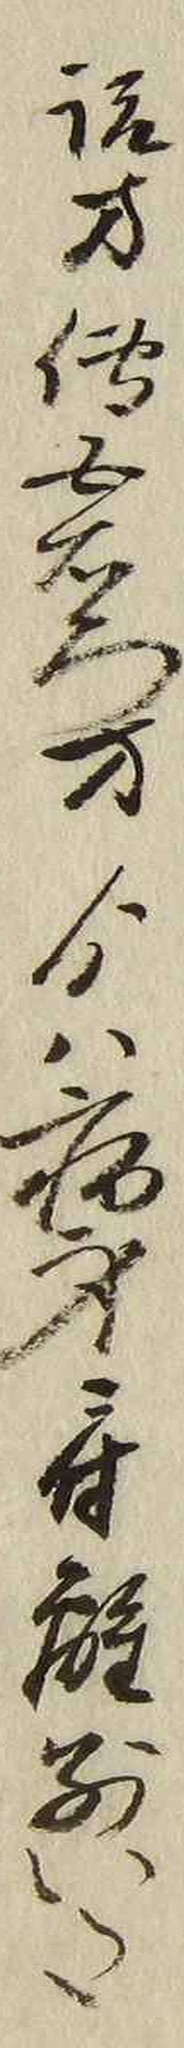諏方伝五右衛門方ゟハ病身ニ付離別いた
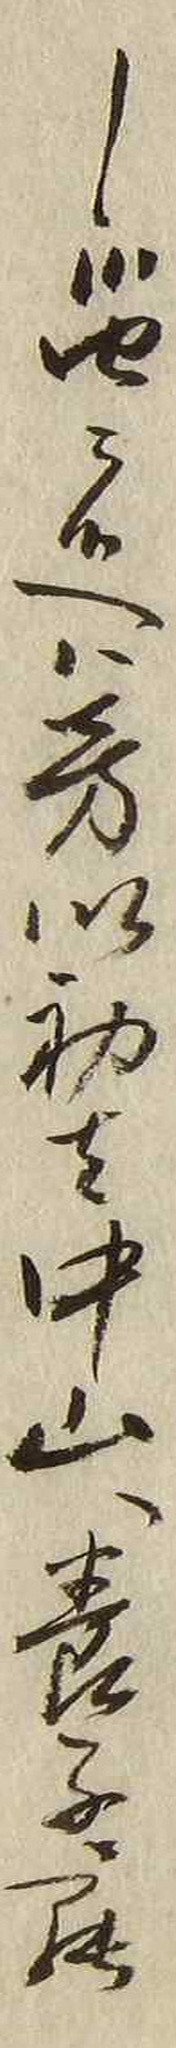し候由ニ候へハ旁以初者中山へ養子ニ罷

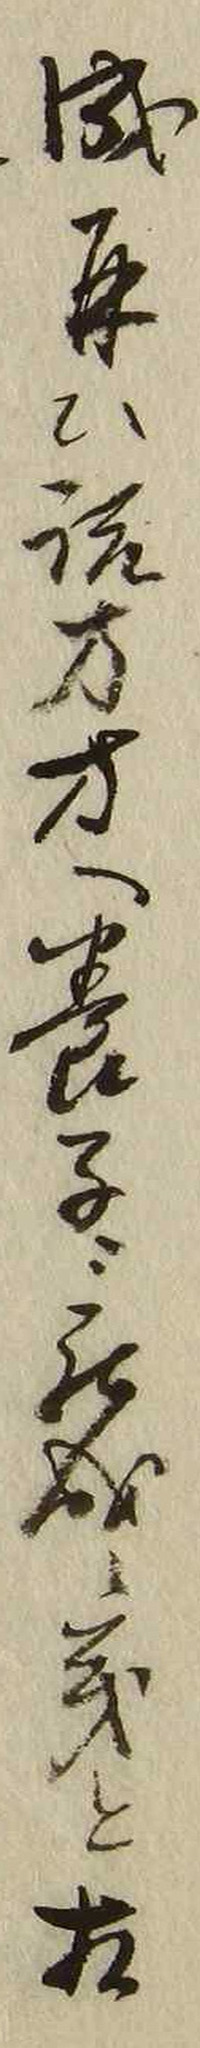成再ひ諏方方へ養子ニ罷成候義と相
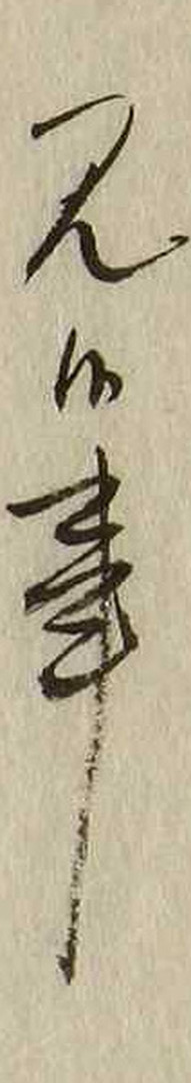見候事
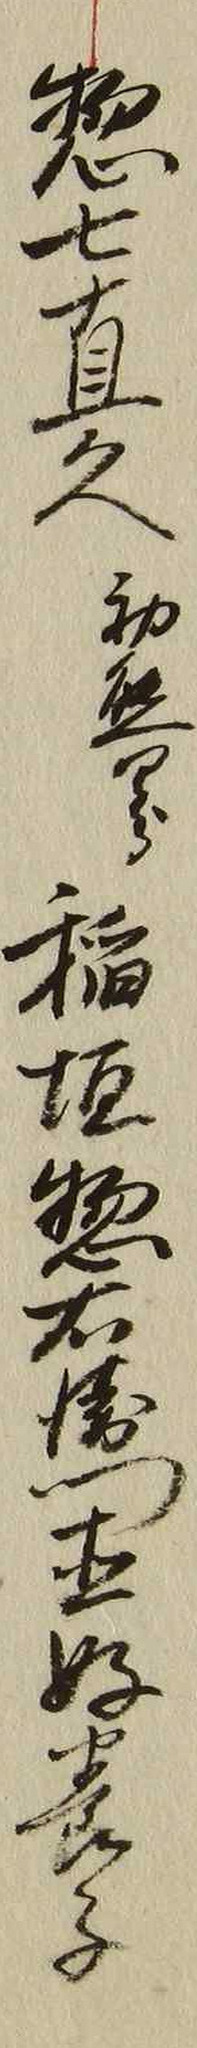惣七直久初熊四郎稲垣惣右衛門直好養子
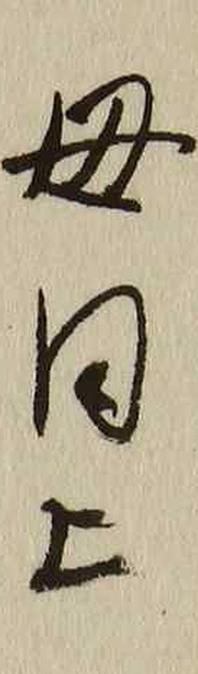母同上
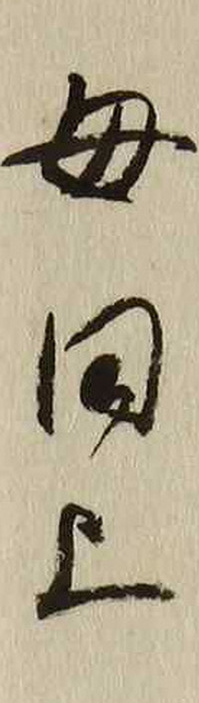母同上
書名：諸士系譜　巻之356　す之部6
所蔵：会津若松市立会津図書館
